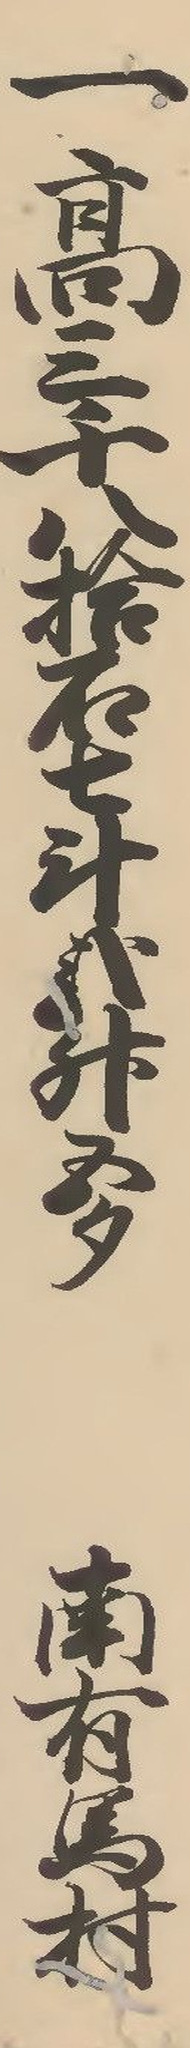一髙三千八拾石七斗弐升五夕南有馬村
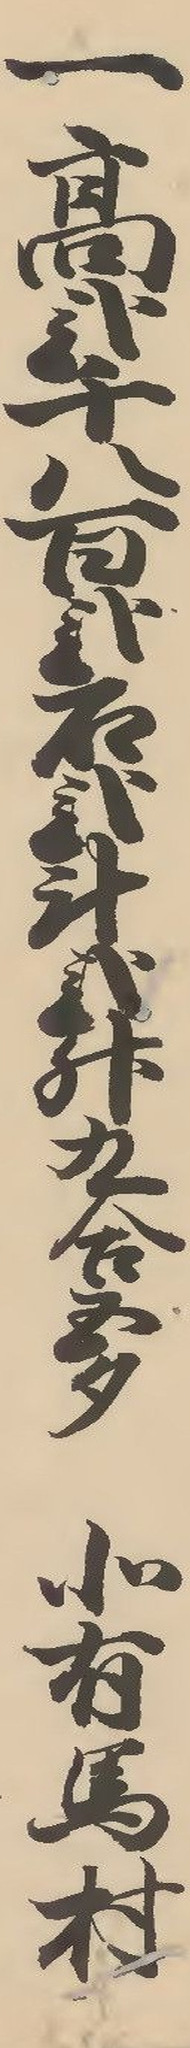一髙弐千八百弐石弐斗弐升九合五夕北有馬村
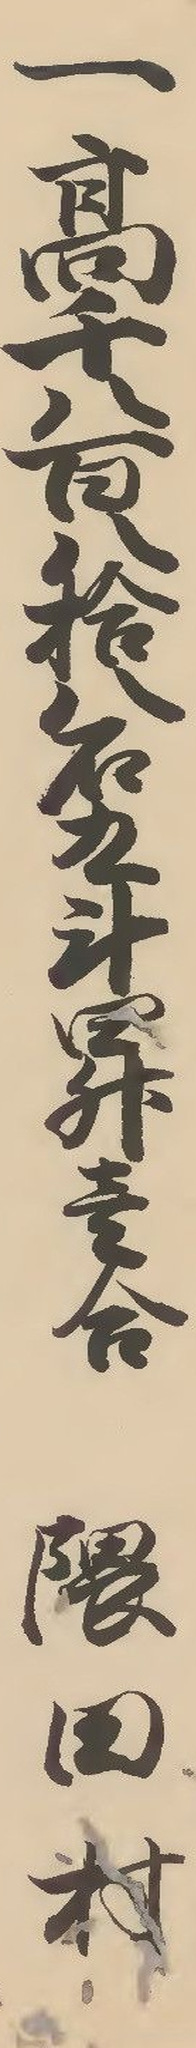一髙千八百八拾八石九斗四升壱合隈田村
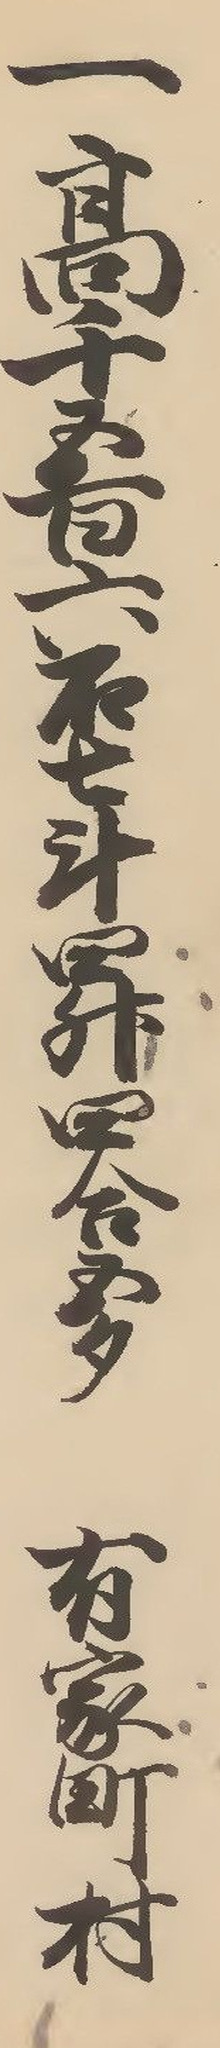一髙千五百六石七斗四升四合五夕有家町村
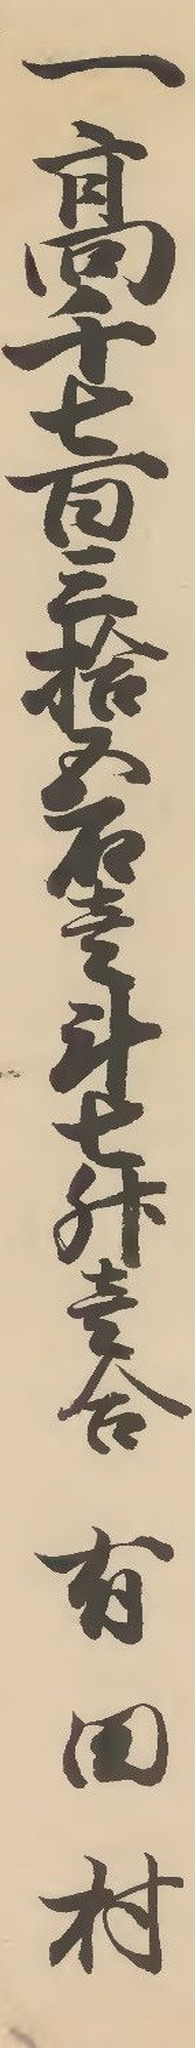一髙千七百三拾五石壱斗七升壱合有田村

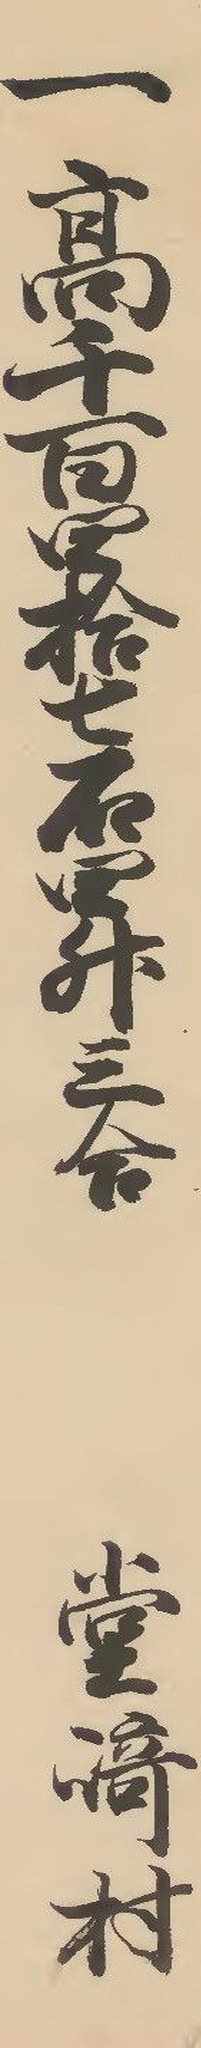一髙千百四拾七石四升三合堂崎村
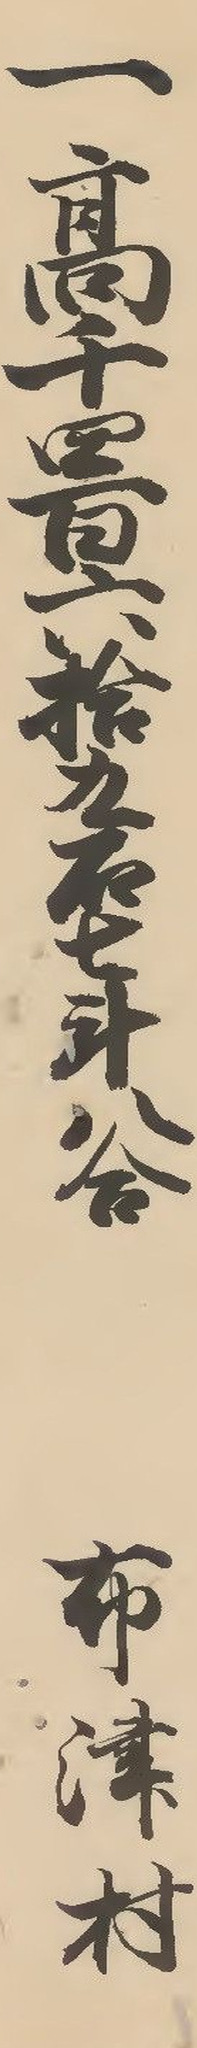一髙千四百六拾九石七斗八合布津村
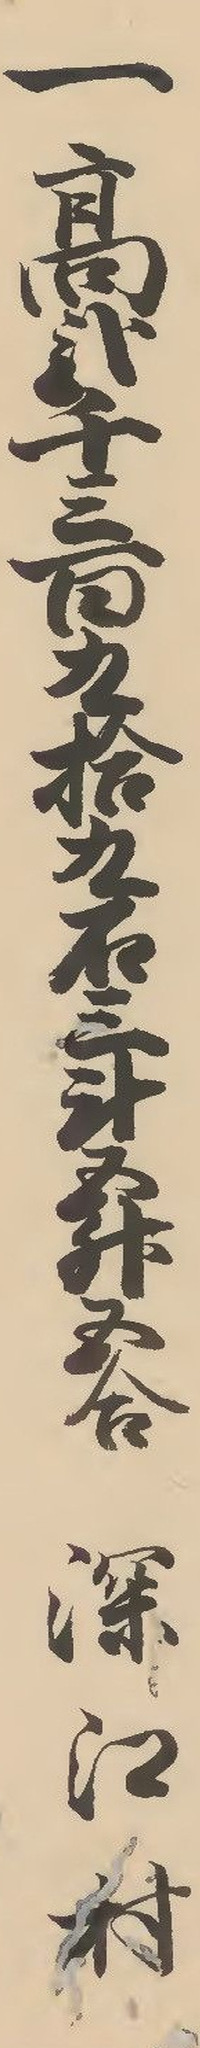一髙弐千三百九拾九石三斗五升五合深江村
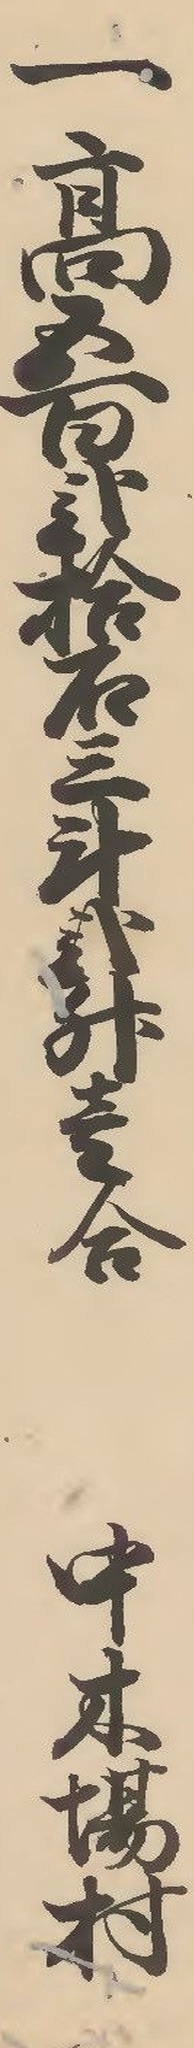一髙五百弐拾石三斗弐升壱合中木場村
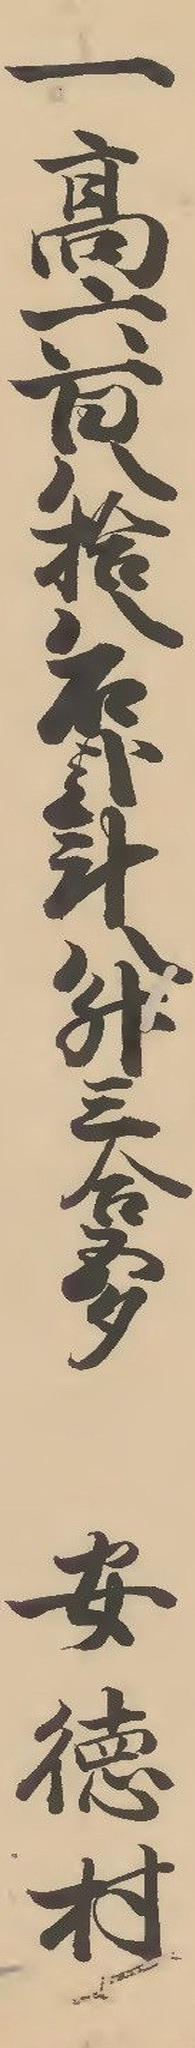一髙六百八拾八石弐斗八升三合五夕安徳村
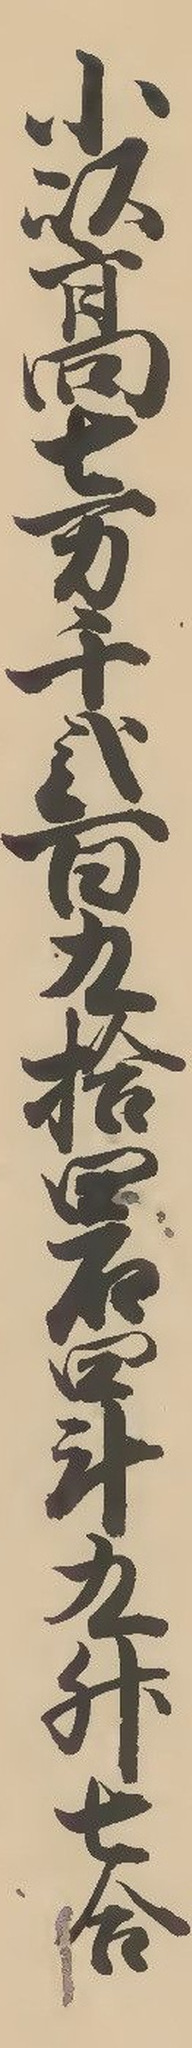小以髙七万千弐百九拾四石四斗九升七合

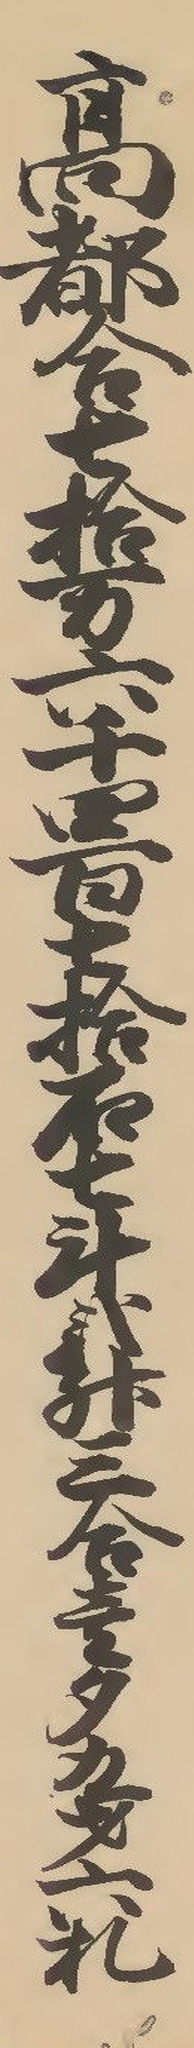髙都合七拾万六千四百七拾石七斗弐升三合壱夕九才六札
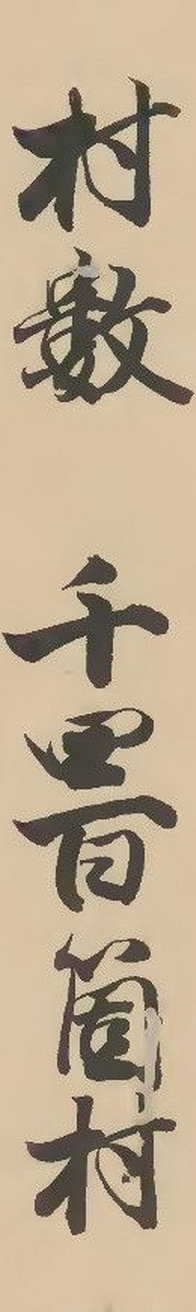村数千四百箇村
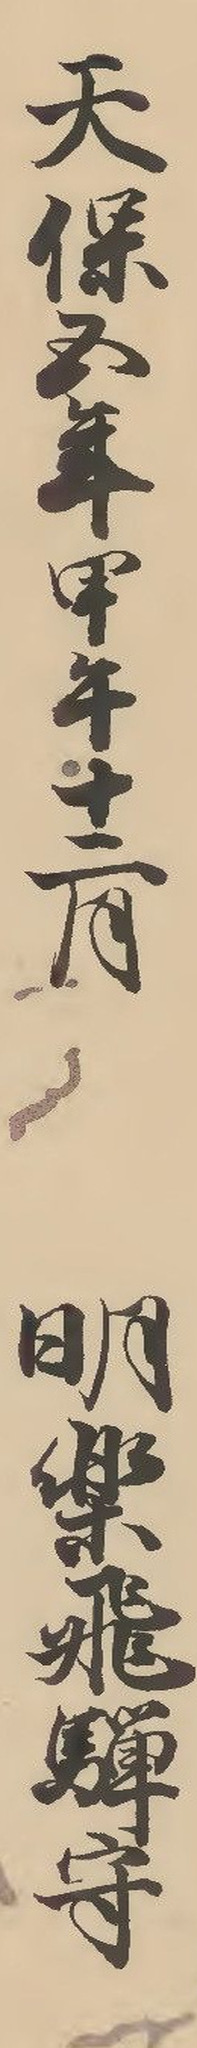天保五年甲午十二月明樂飛騨守
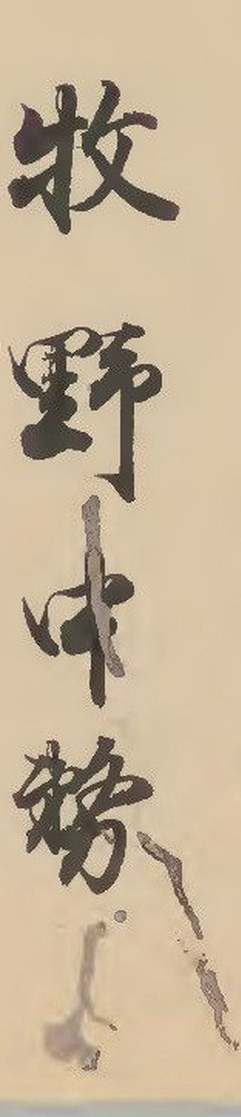牧野中務
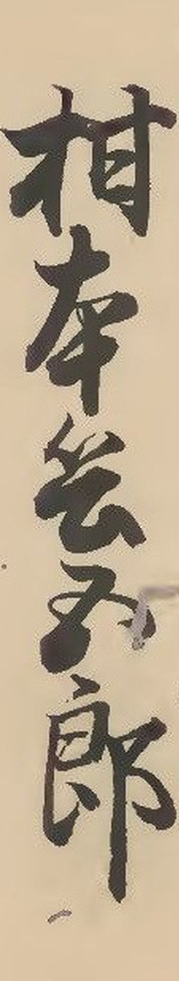柑本兵五郎
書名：肥前国郷帳
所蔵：国立公文書館 National Archives of Japan
